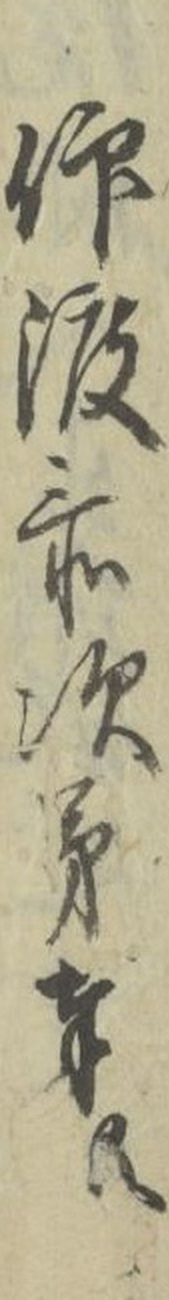仰渡前次第奉
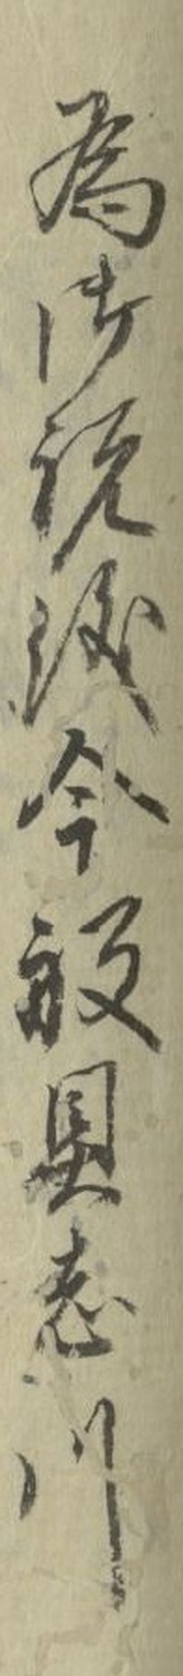為御祝儀今般具志川
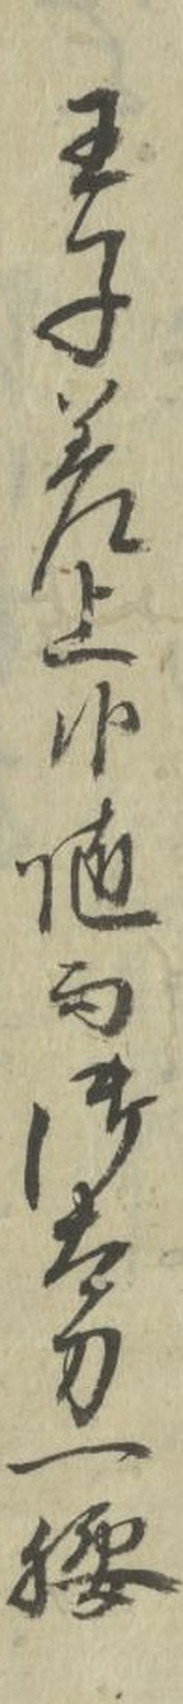王子差上候随而御太刀一腰
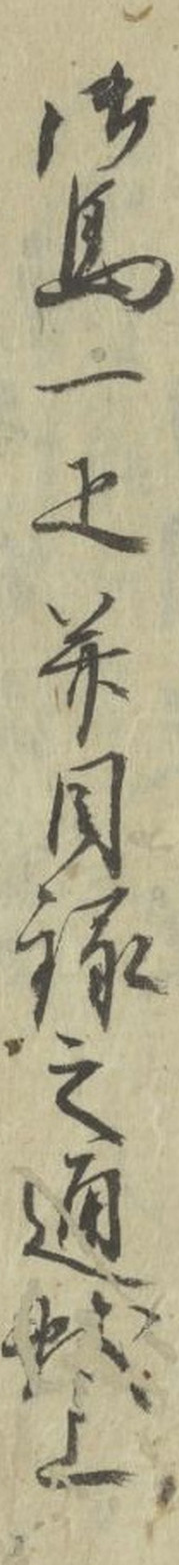御馬一疋幷目録之通献上
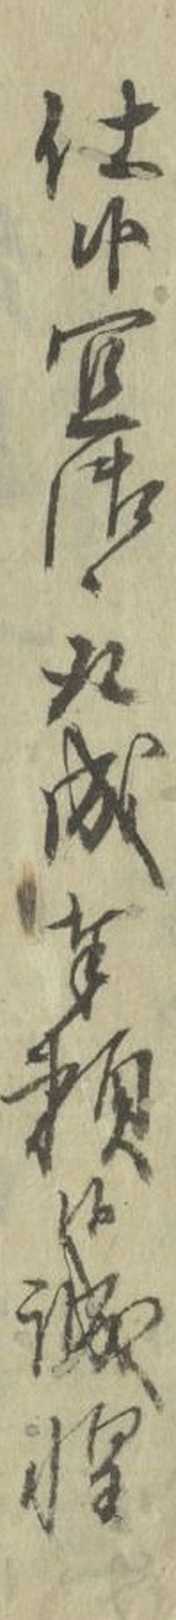仕候宜御取成奉頼候誠惶

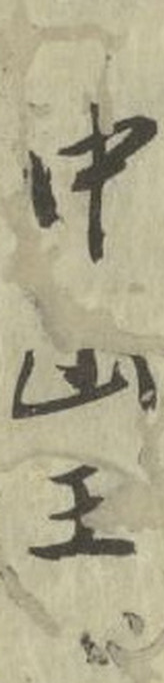中山王
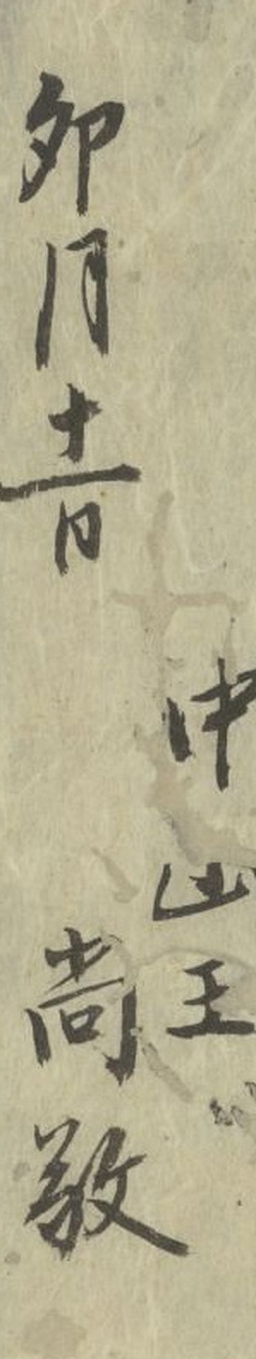卯月十一日尚敬
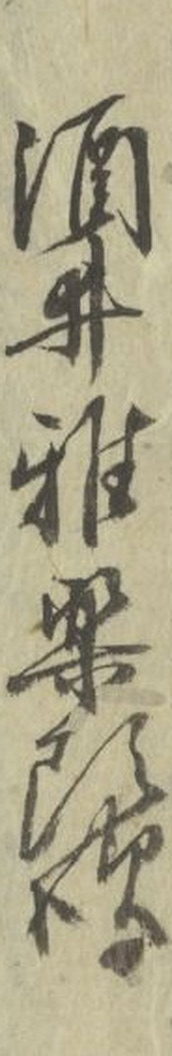酒井雅楽頭様
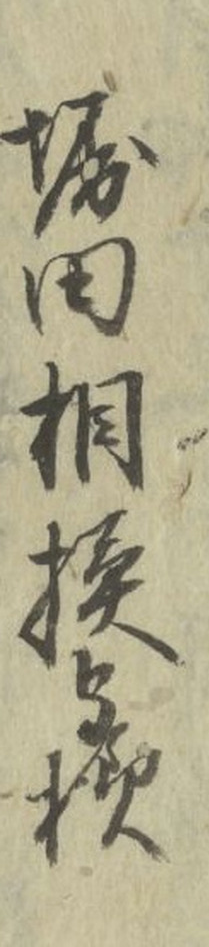堀田相模守様
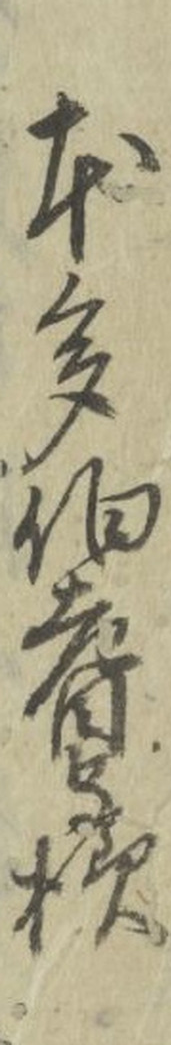本多伯耆守様
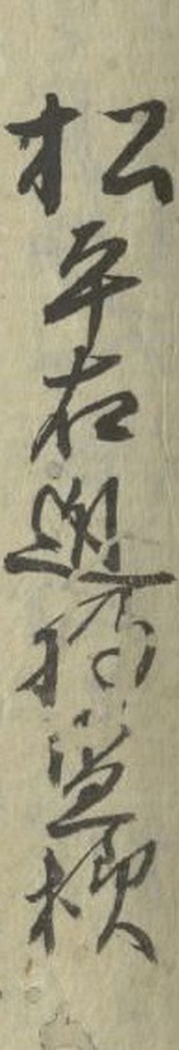松平右近将監様
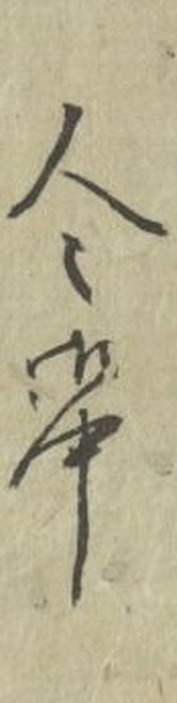人々御中
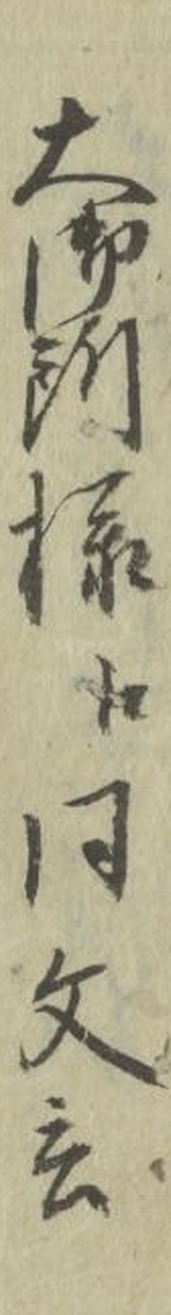大御所様え同文言
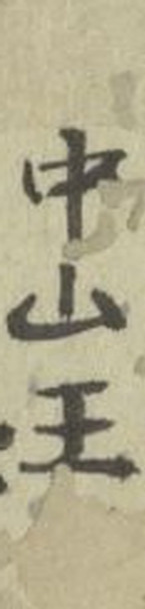中山王
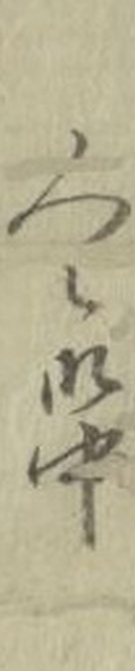人々御中

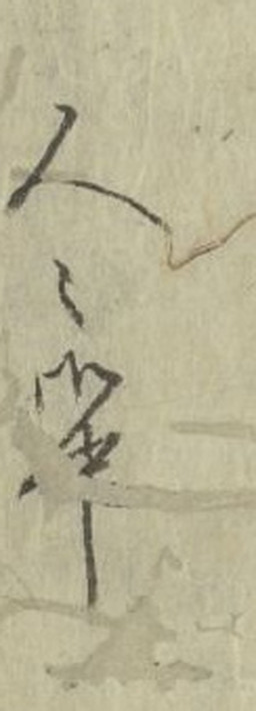人々御中
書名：琉球来朝記 自八至十四終
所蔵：University of the Ryukyus Library
